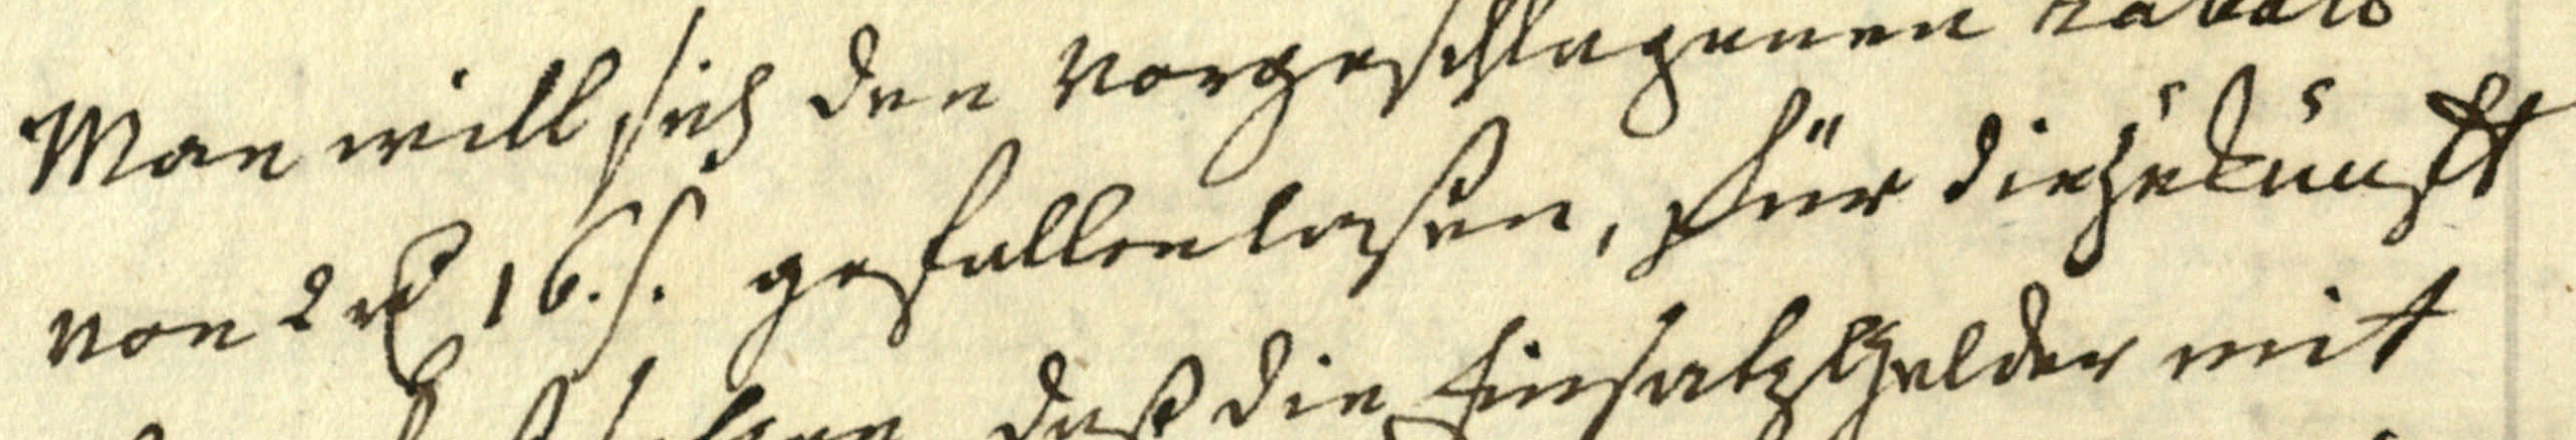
von 2 r. 16 s. gefallen laßen, für die Zukunft
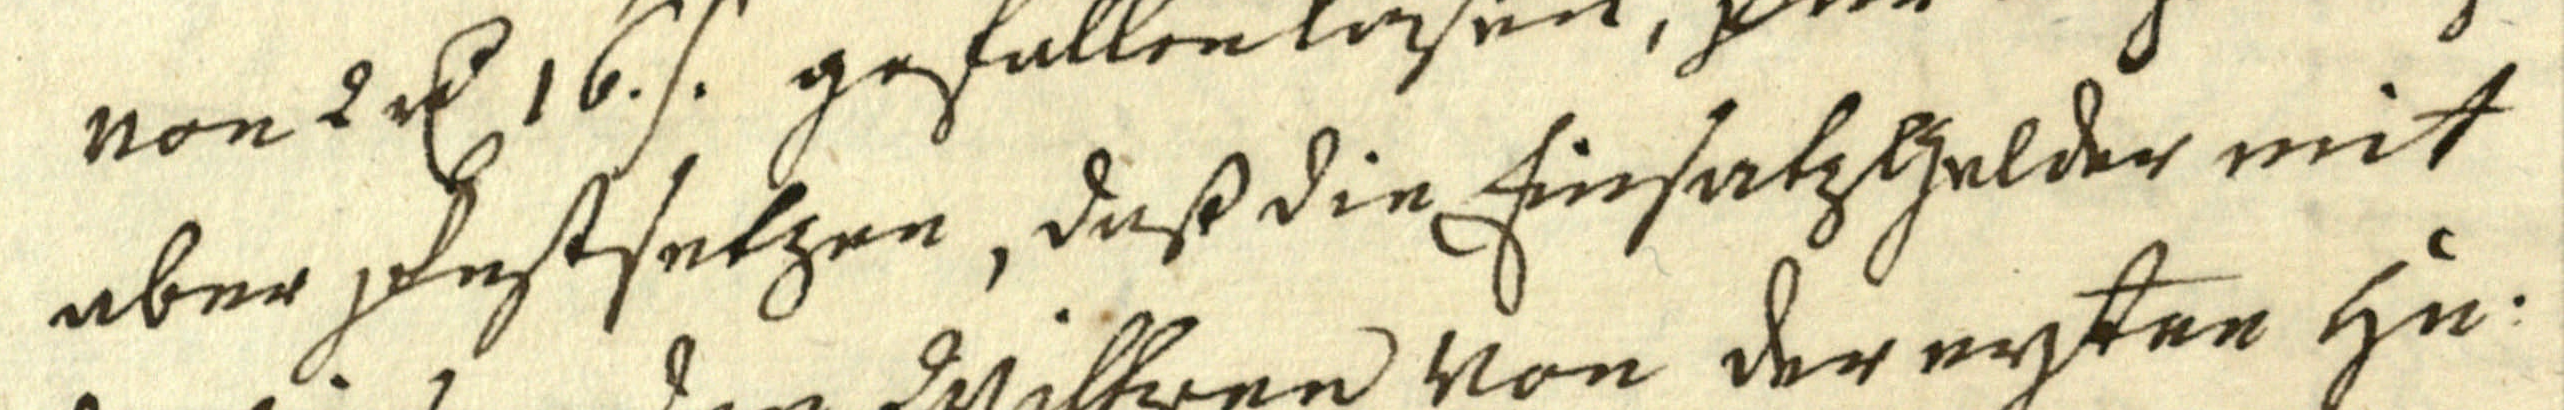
aber festsetzen, daß die EinsatzGelder mit
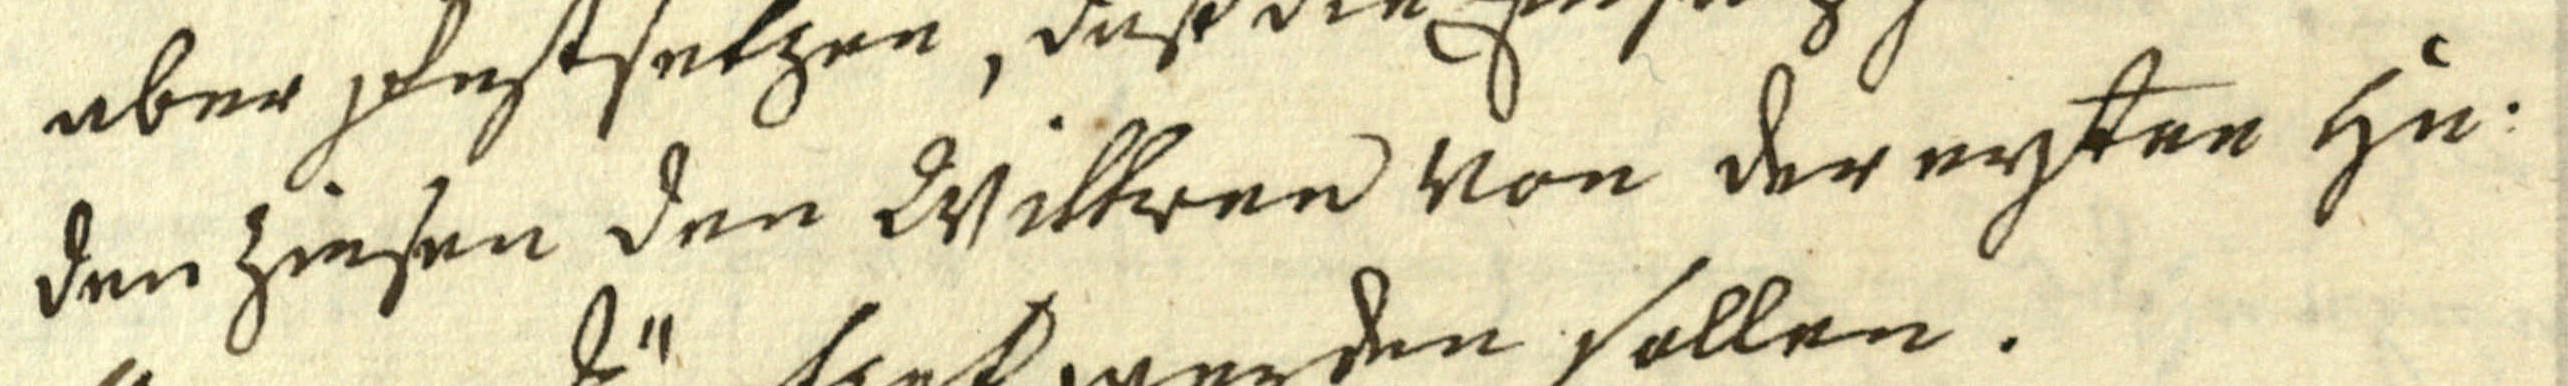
den Zinsen den Wittwen von der ersten He¬
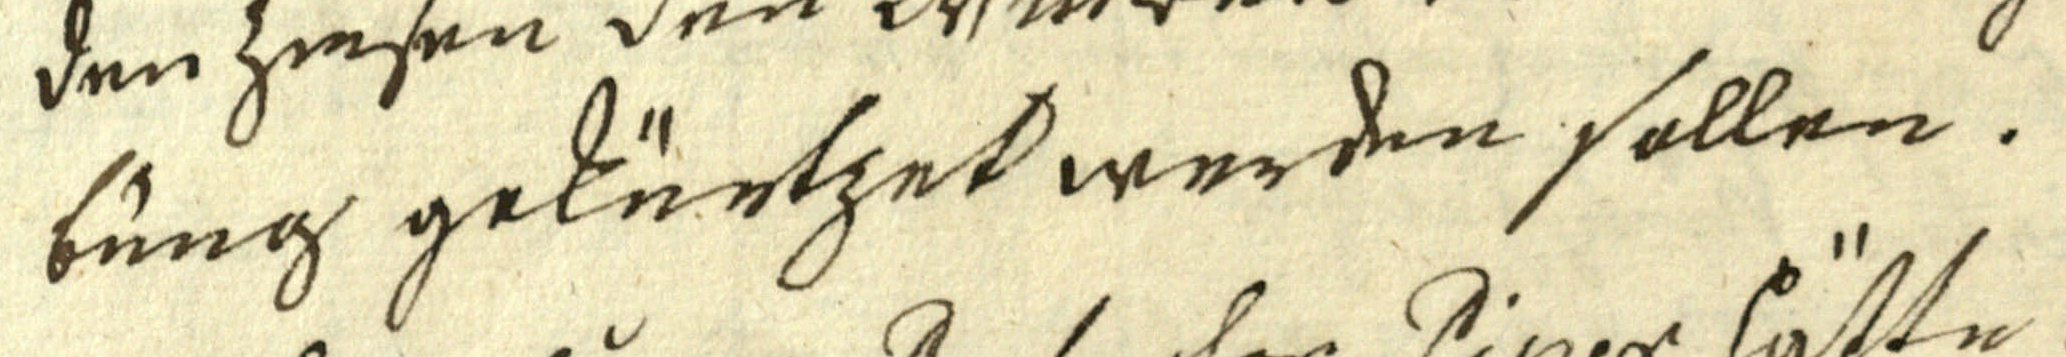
bung gekürtzet werden sollen.
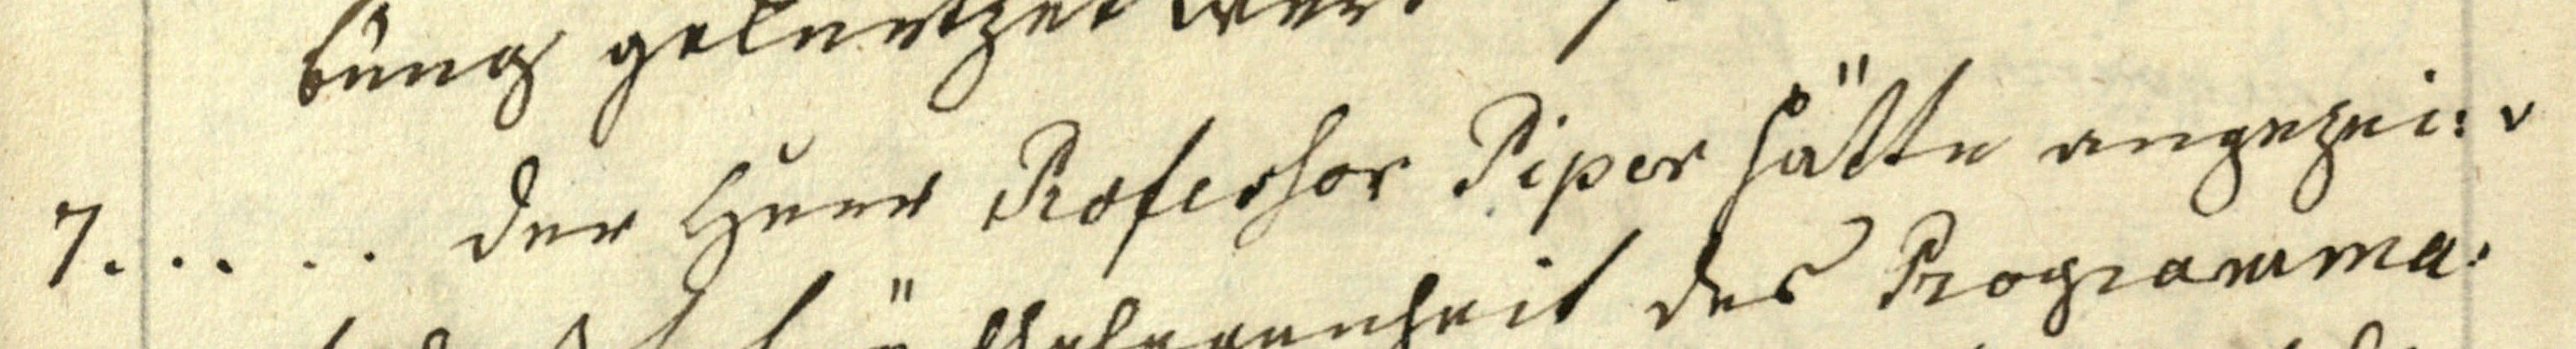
7. Der Herr Professor Piper hätte angezei¬
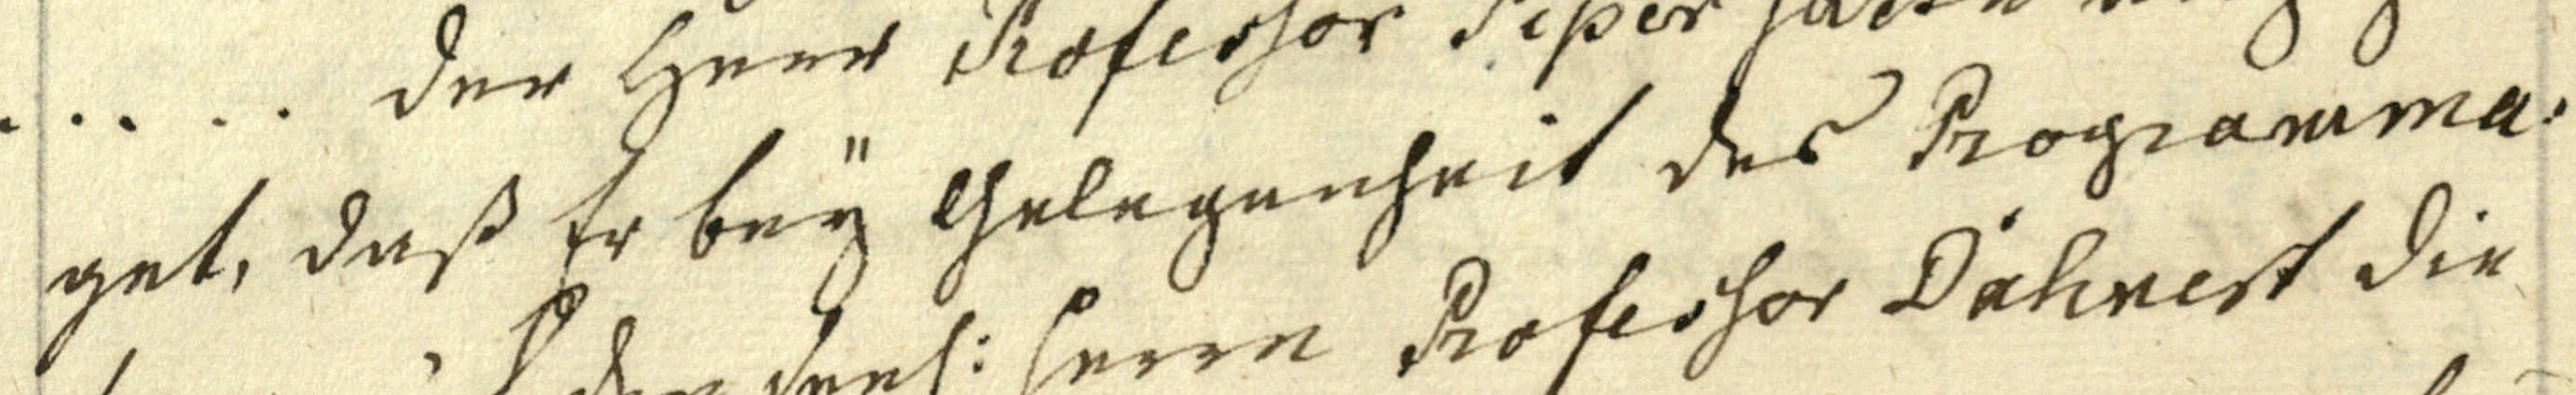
get, daß Er beÿ Gelegenheit des Programma¬
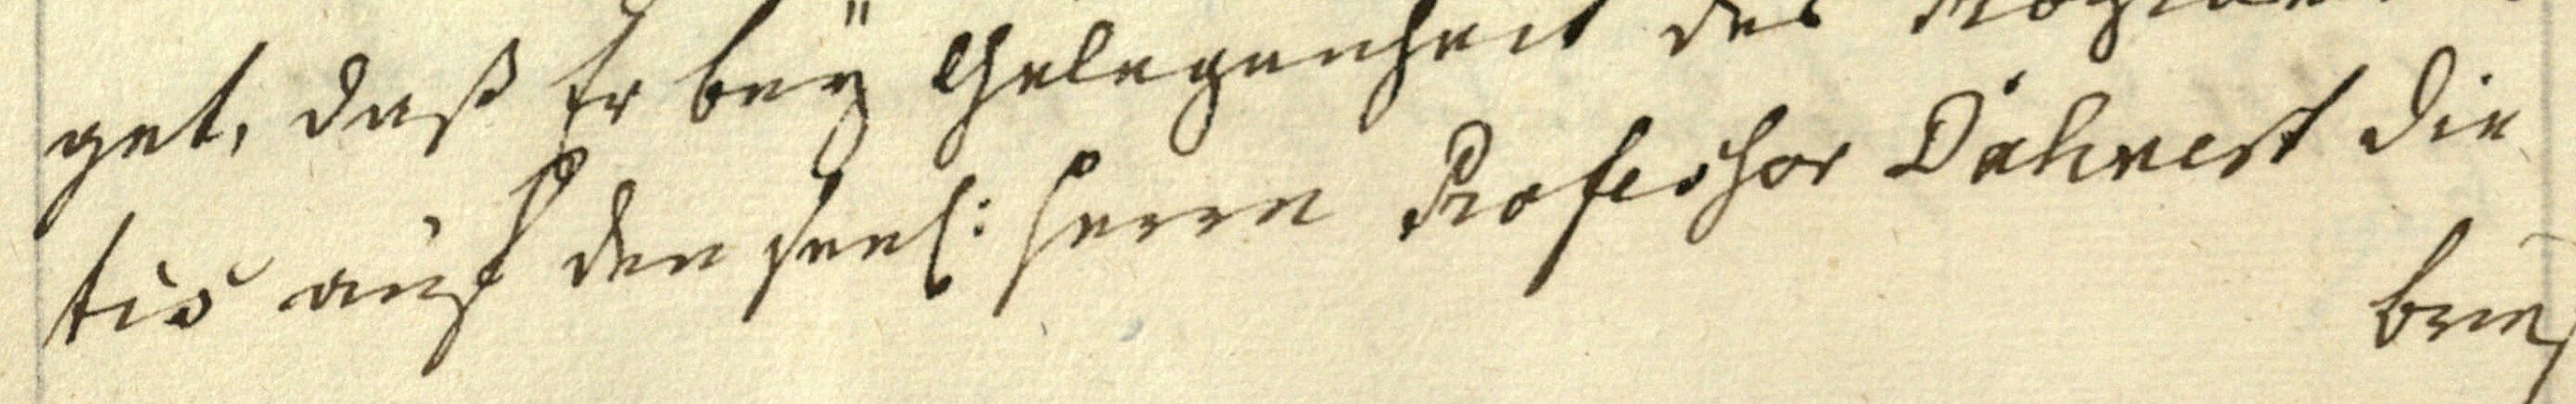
tis auf den seel. Herrn Professor Dähnert die
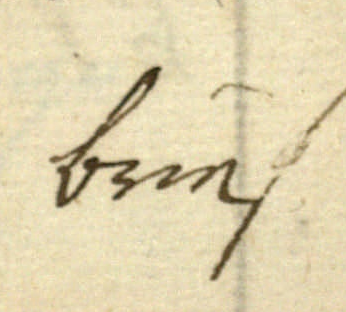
br
